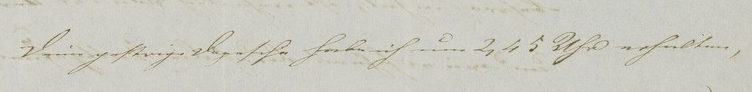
Deine gestrige Depesche habe ich um 2,45 Uhr erhalten,
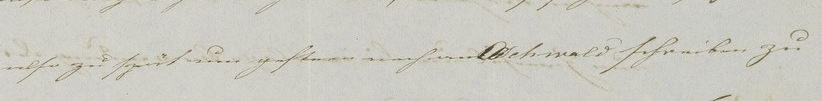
also zu spät um gestern noch an Oschwald schreiben zu
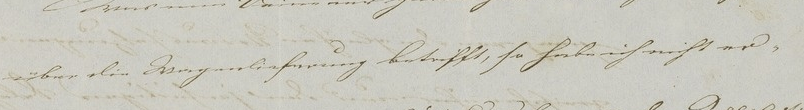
über die Wagenlieferung betrifft, so habe ich nicht er-
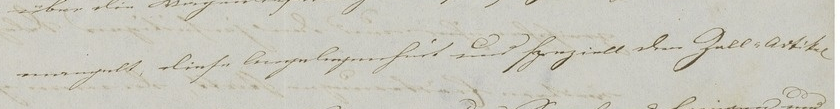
mangelt, diese Angelegenheit und speziell den Zoll-Artikel
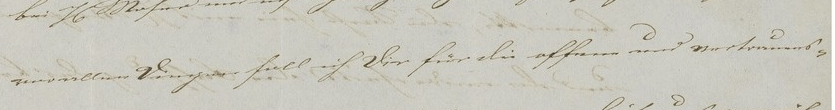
vor allen Dingen soll ich Dir für die offene und vertrauens-
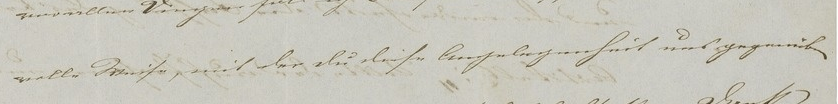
volle Weise, mit der Du diese Angelegenheit uns gegenüber
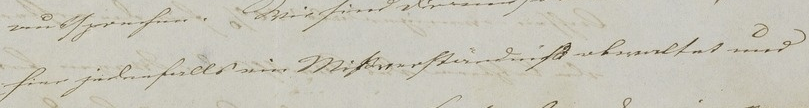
hier jedenfalls ein Mißverständniß obwaltet und
